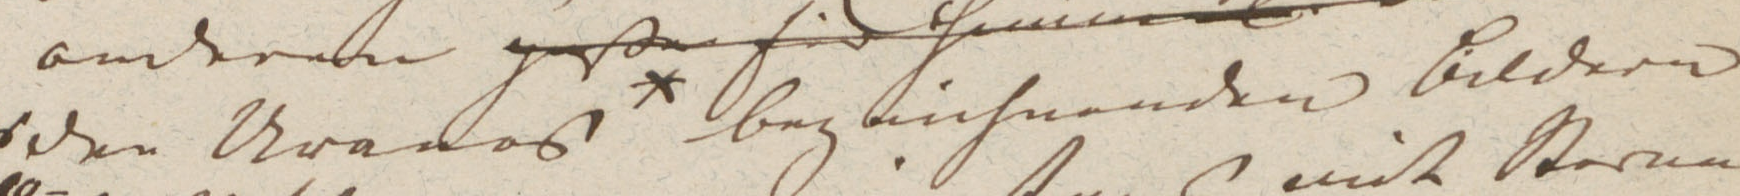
den Uranos % bezeichnenden Bildern
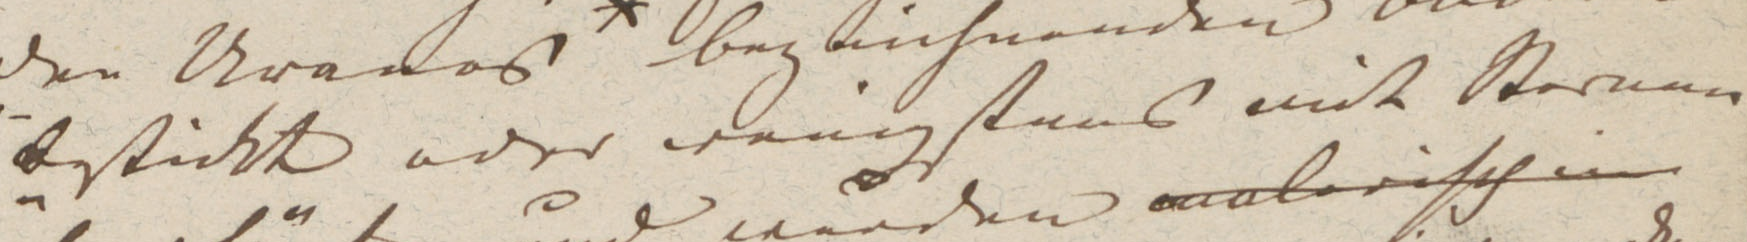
bestickt oder wenigstens mit Sternen
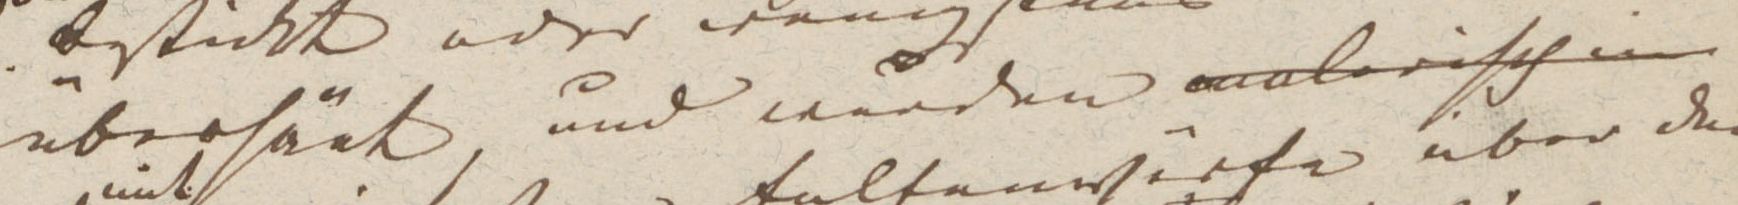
übersäet und wurden malerisch in
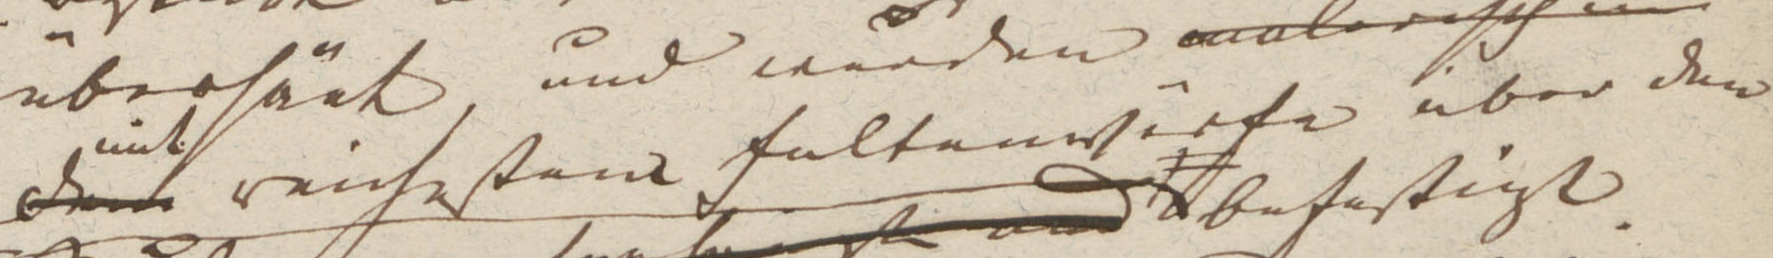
dem mit reichestenm Faltenwurfe über den
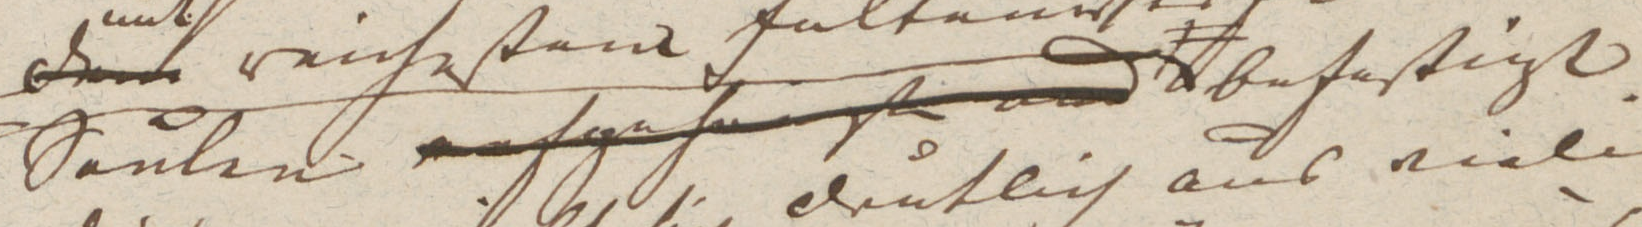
Säulen aufgehängt undund %% befestigt.
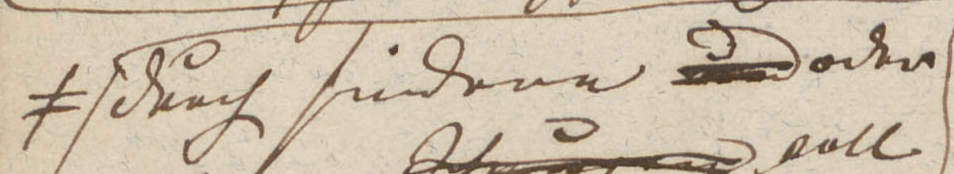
% % durch seidene und oder
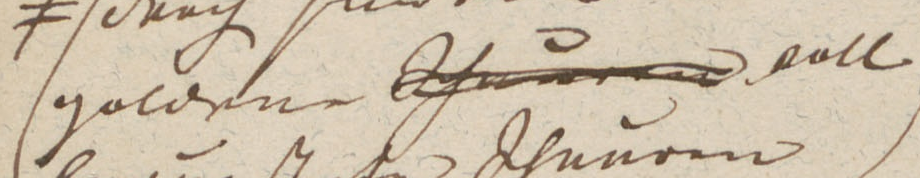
goldene Schnüren voll
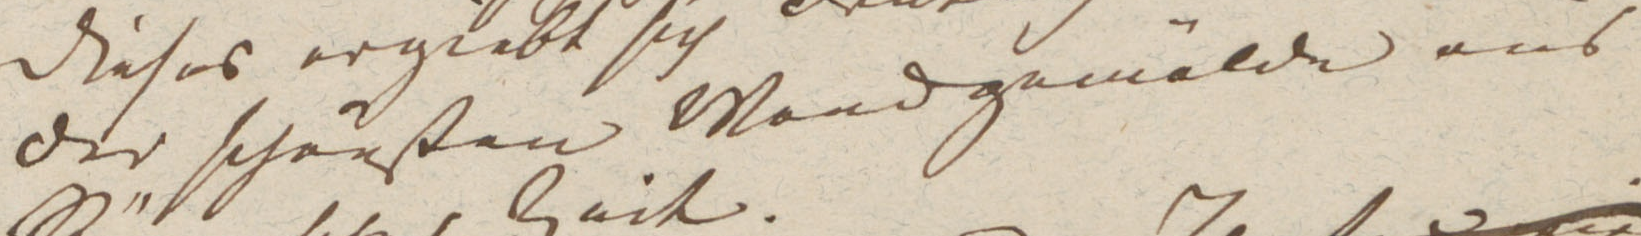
der schönsten Wandgemälde aus
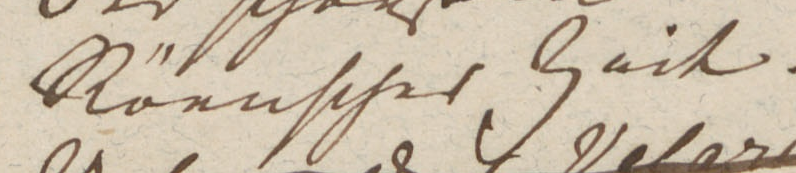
Römischer Zeit.
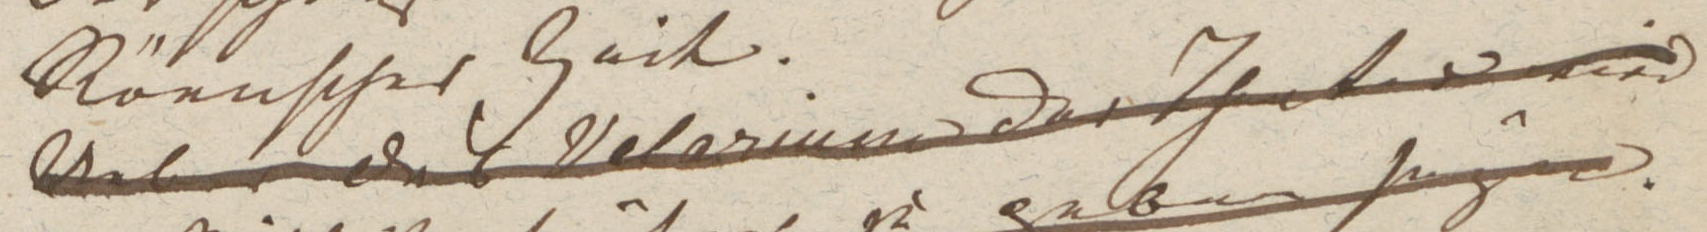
Ueber das Velarium der Theater wird
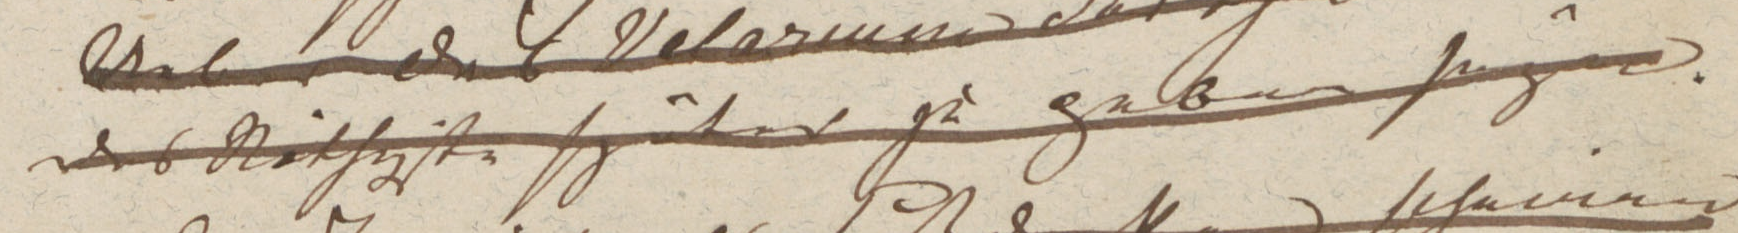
das Nöthigste später zu geben seyn.
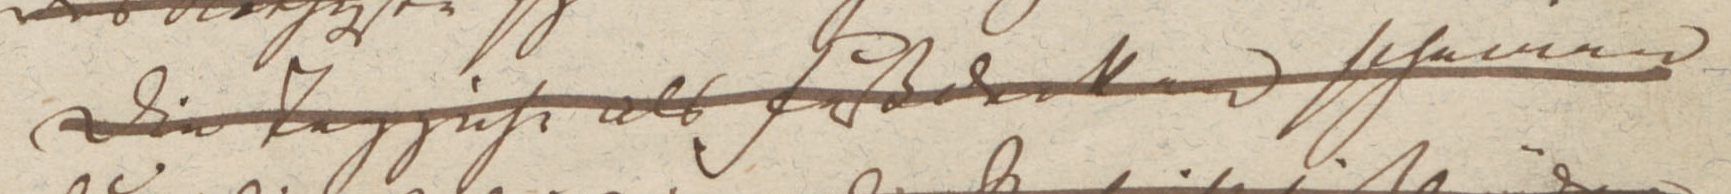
Die Teppiche als Fussdecken scheinen
